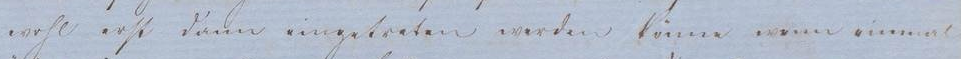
wohl erst dann eingetreten werden könne wenn einmal
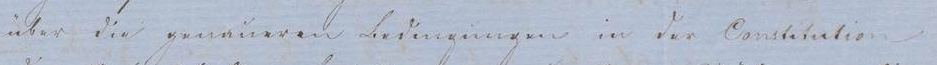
über die genaueren Bedingungen in der Constitution
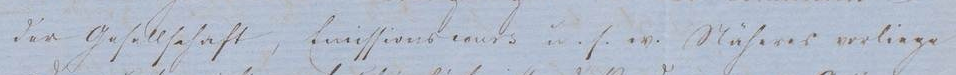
der Gesellschaft, Emissionscours u. s. w. Näheres vorliege.
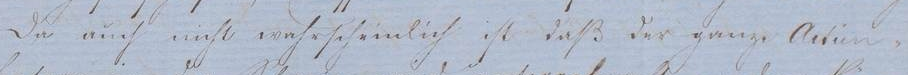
Da auch nicht wahrscheinlich ist daß der ganze Actien-
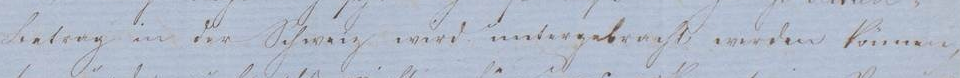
Betrag in der Schweiz wird untergebracht werden können,
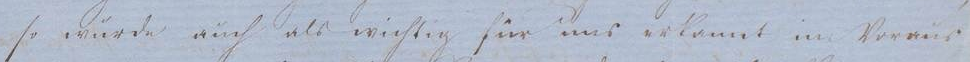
so würde auch als wichtig für uns erkannt im Voraus
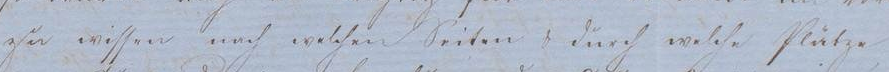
zu wissen nach welchen Seiten & durch welche Plätze
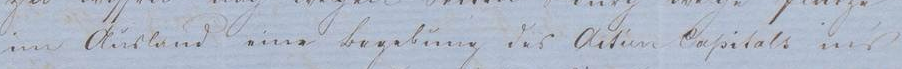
im Ausland eine Begebung des Actien Capitals ins
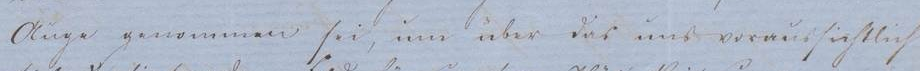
Auge genommen sei, um über das uns voraussichtlich
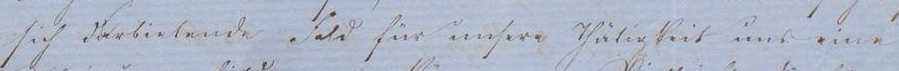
sich darbietende Feld für unsere Thätigkeit uns eine
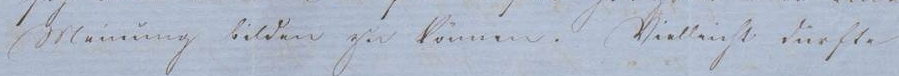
Meinung bilden zu können. Vielleicht dürfte
